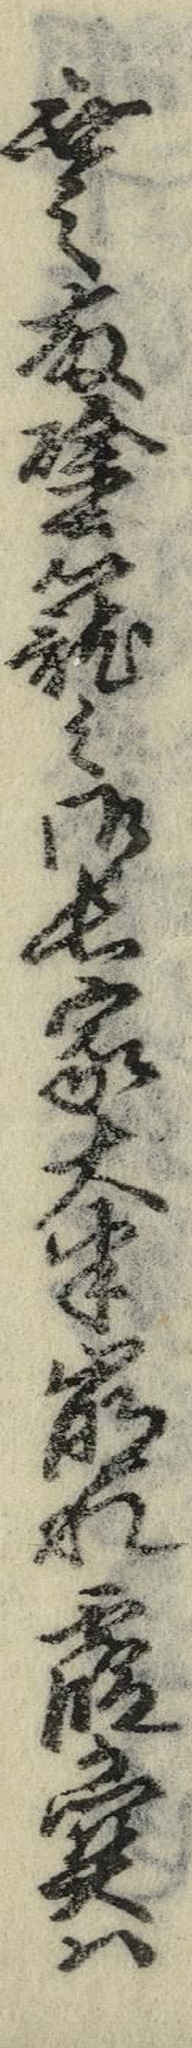無之故塗籠之御長家大半崩れ霞か関は
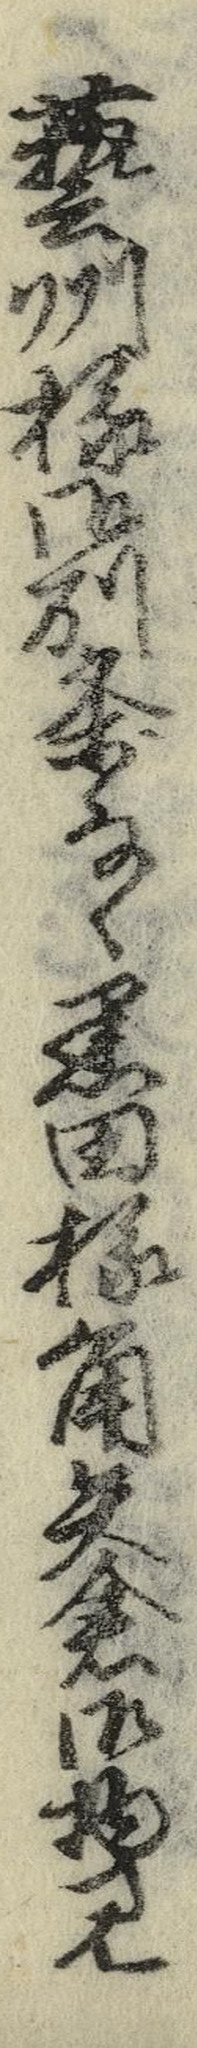藝州様御別条なく黒田様角矢倉御物見
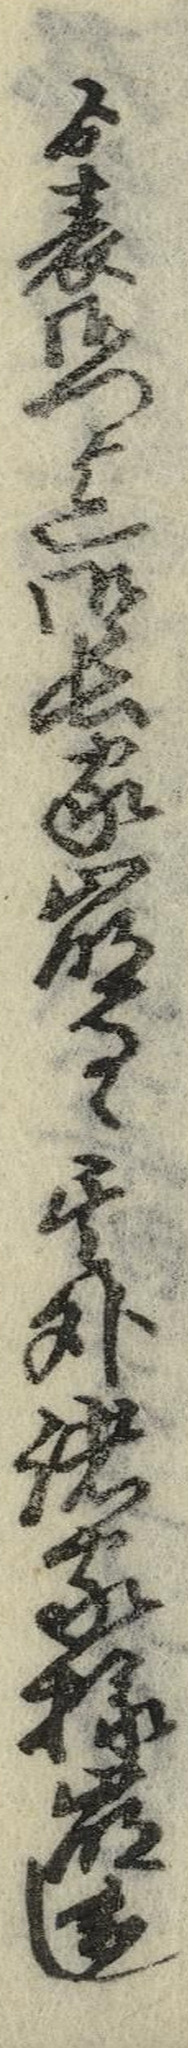ゟ表御門迄御長家崩なし其外諸家様崩多し
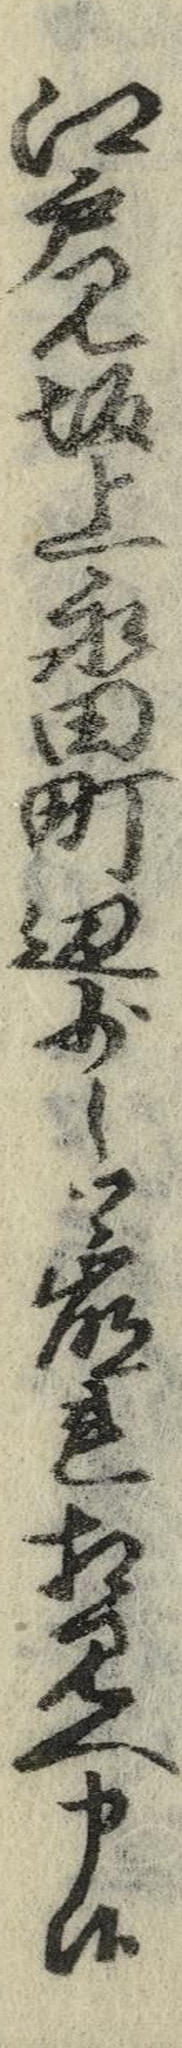江戸見坂上永田町辺少しつゝ崩れ相見へ申候
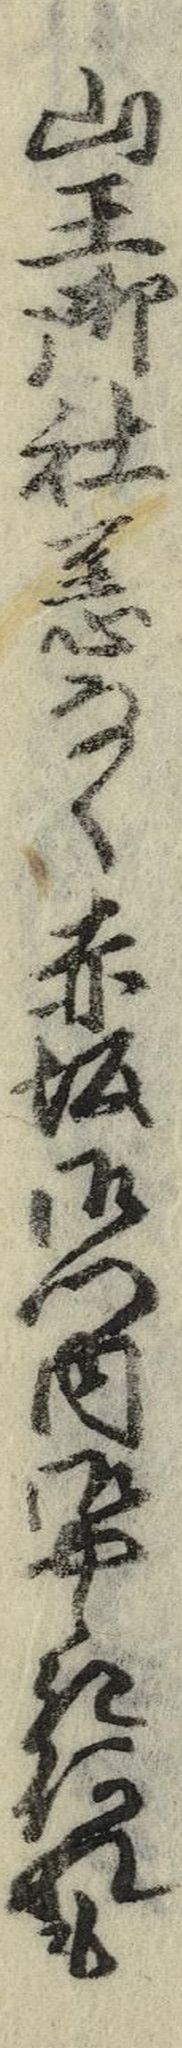山王御社恙なく赤坂御門内御やしき何れも
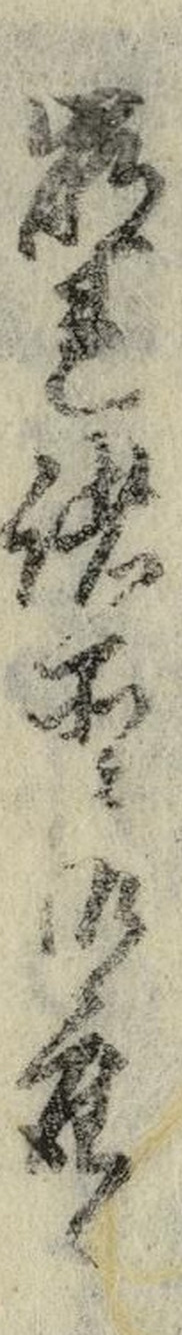崩れ諸所々御座候

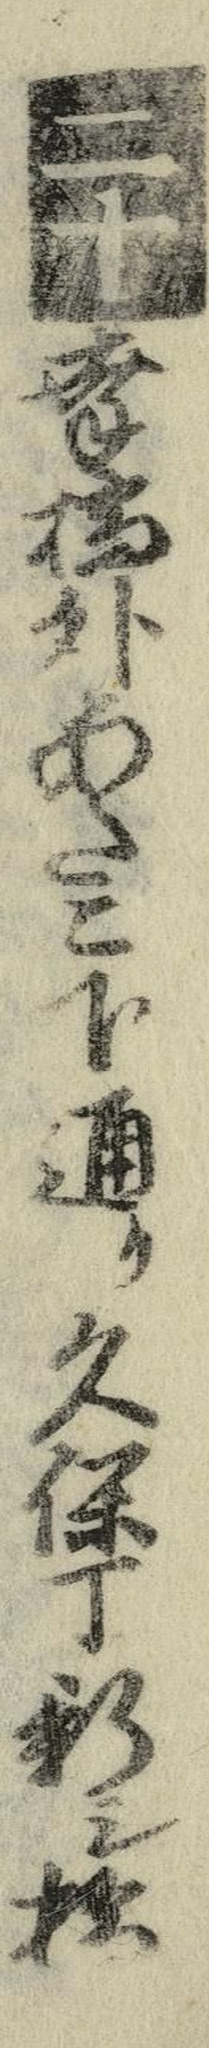二十幸橋外あたこ下通り久保丁新橋
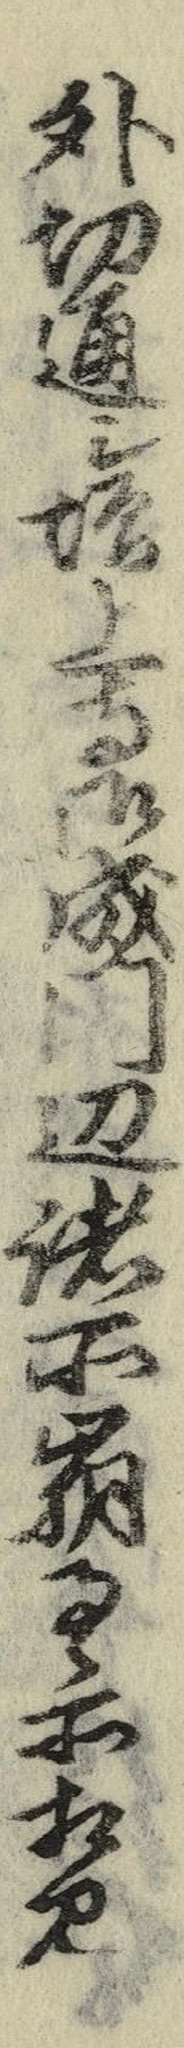外切通シ増上寺御成門辺諸所崩るゝ所相見
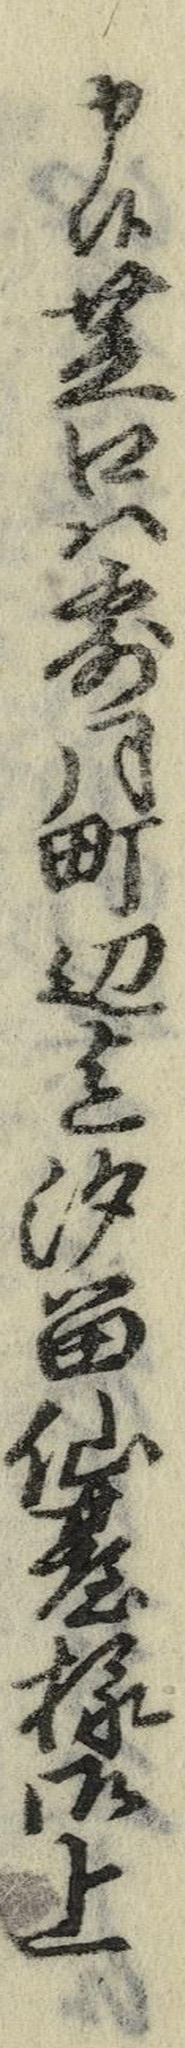申候芝口は寄月町辺迄汐留仙台様御上
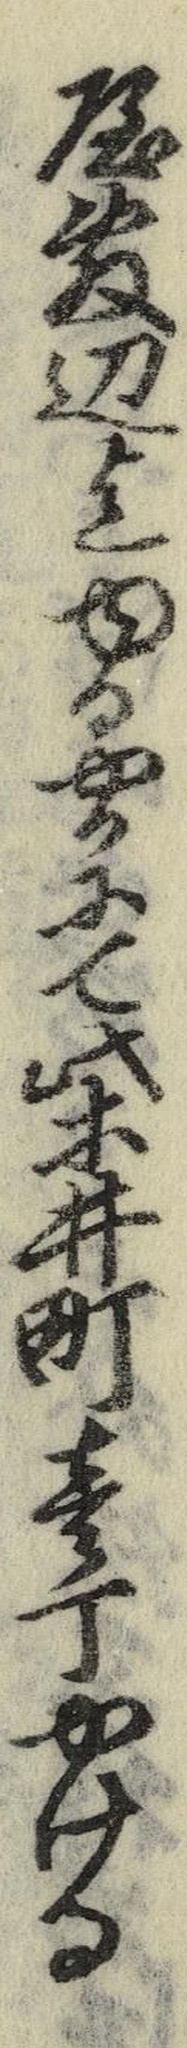屋敷辺迄ゆるやかにて柴井町壱丁やける
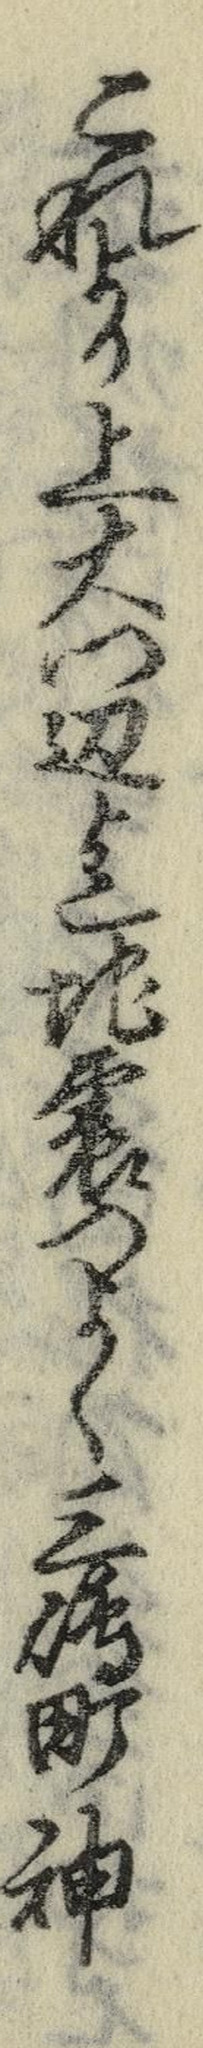これより上大門辺迄地震つよく三嶋町神
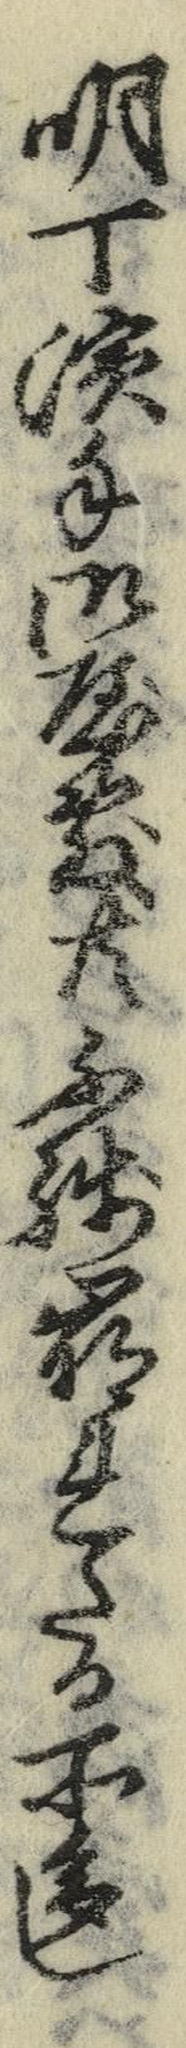明丁浜手御屋敷共不残崩れたる所多し
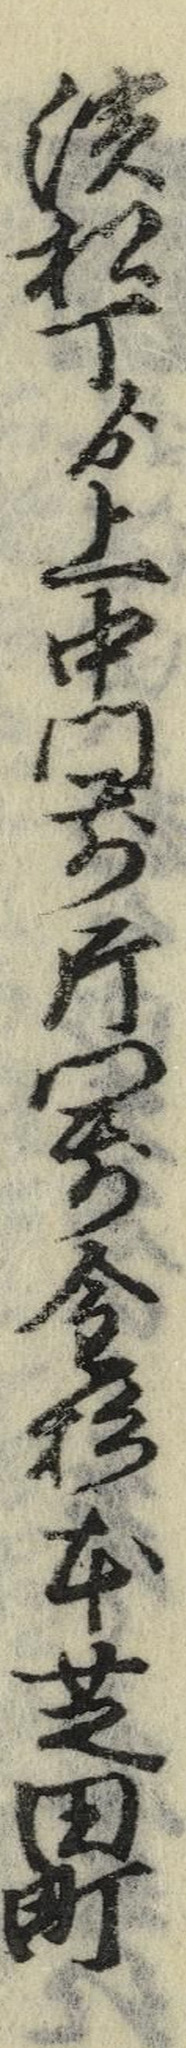浜松丁ゟ上中門前片門前金杉本芝田町
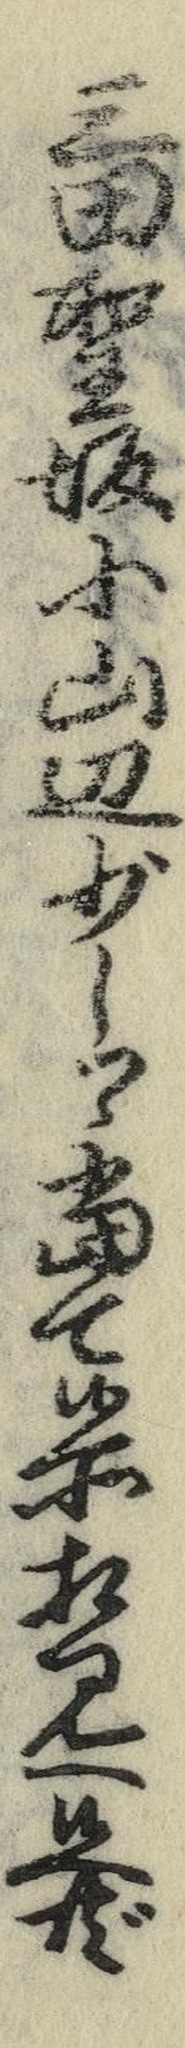三田聖坂小山辺少しつゝ当て候所相見へ候へ共
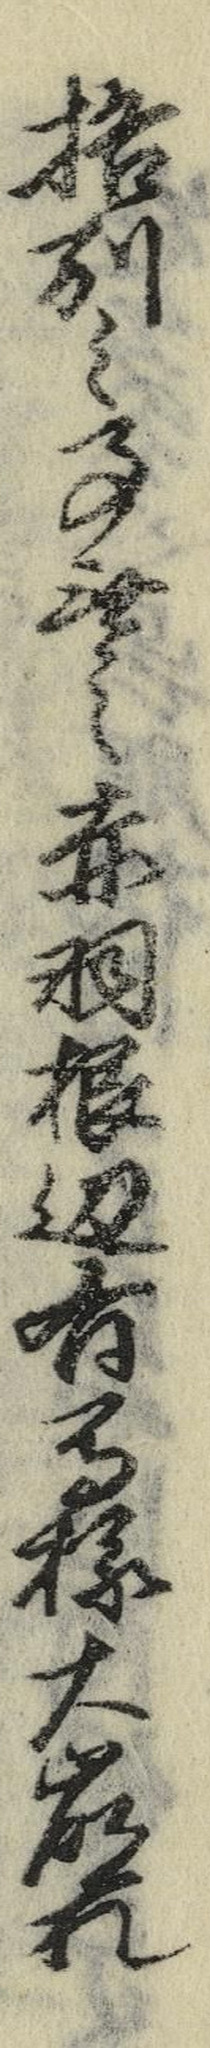格別之事無之赤羽根辺有馬様大崩れ
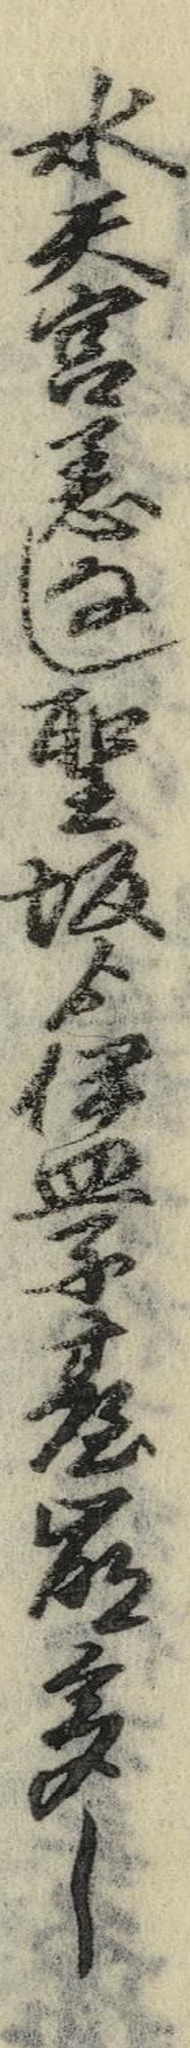水天宮恙なし聖坂ゟ伊皿子台崩多し
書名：地震類焼場所明細書之写　安政二卯年十月二日夜四ツ時過　御府内御屋敷方市中共、并街道筋近郷聞書
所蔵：東京大学地震研究所図書室 Earthquake Research Institute Library, The University of Tokyo, JAPAN
